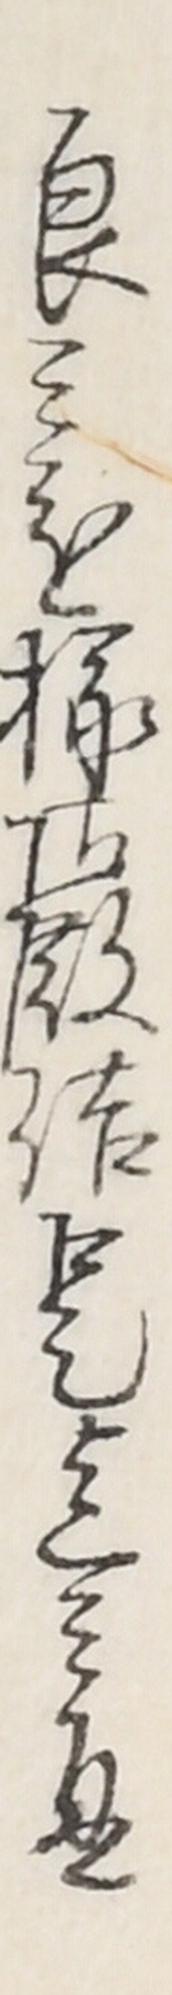良之進様御殿詰是迄之通
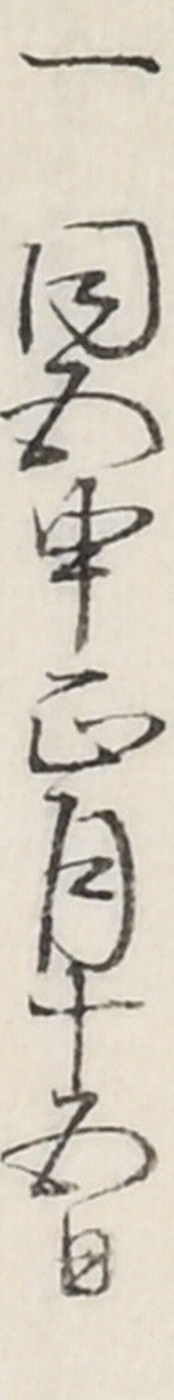一同五申正月十五日
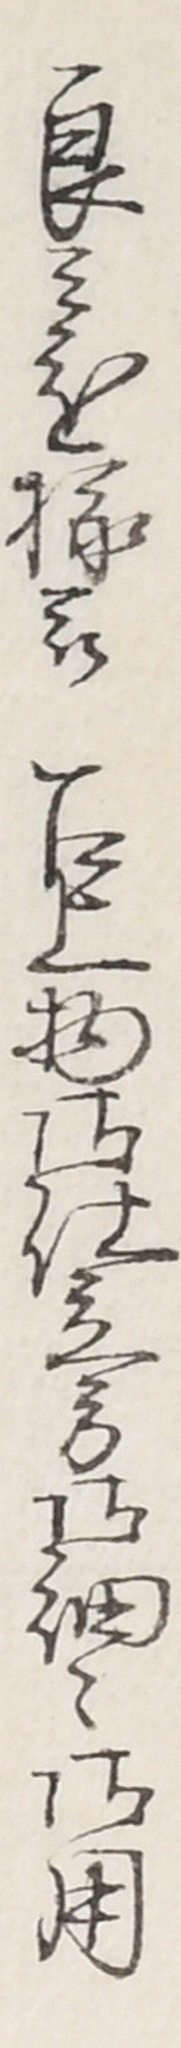良之進様被召上物御仕立方御細々御用
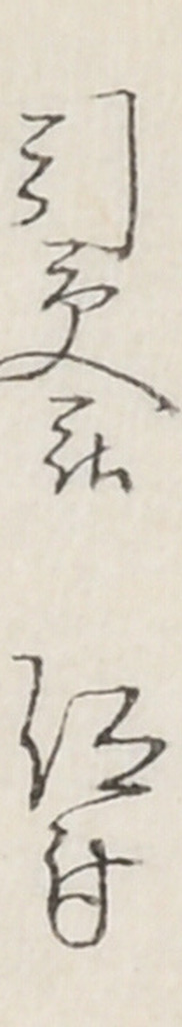引受被仰付
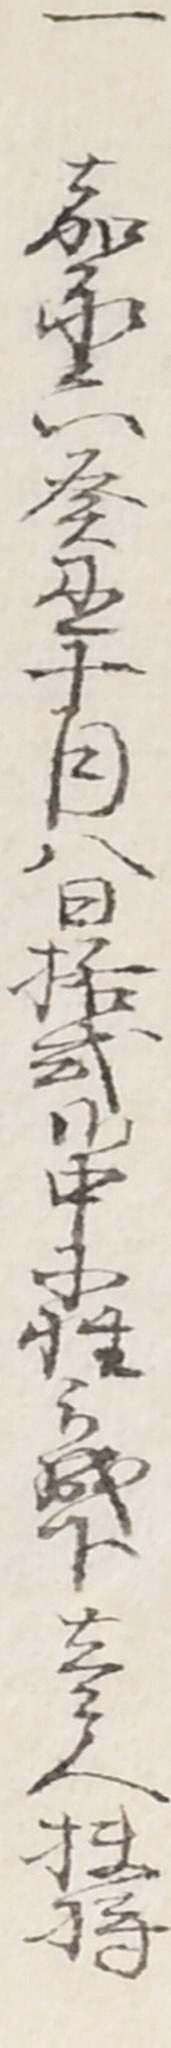一嘉永六癸丑十月八日格式御中小性被成下壱人扶持
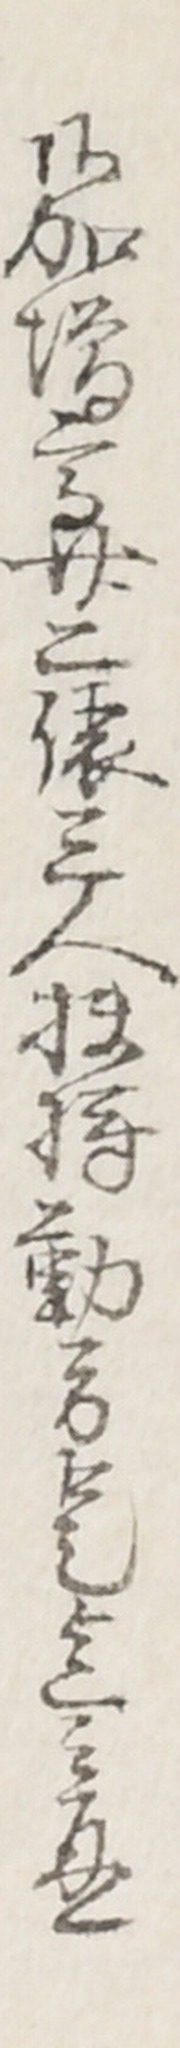御加増高廿二俵三人扶持勤方是迄之通

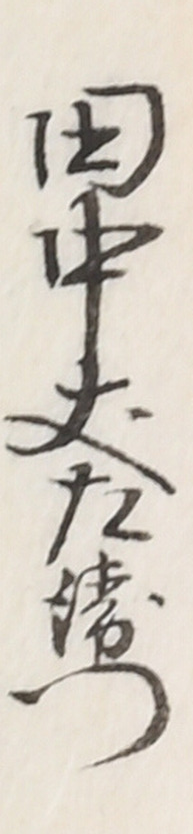田中丈左衛門
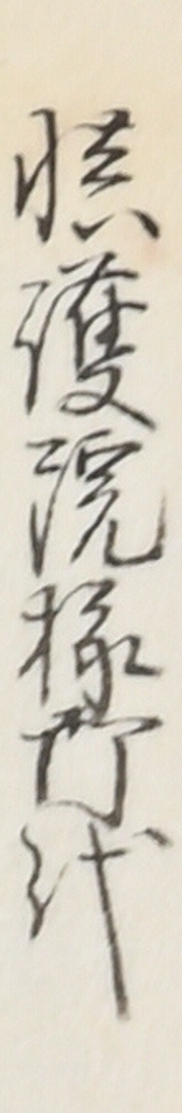慎護院様御代
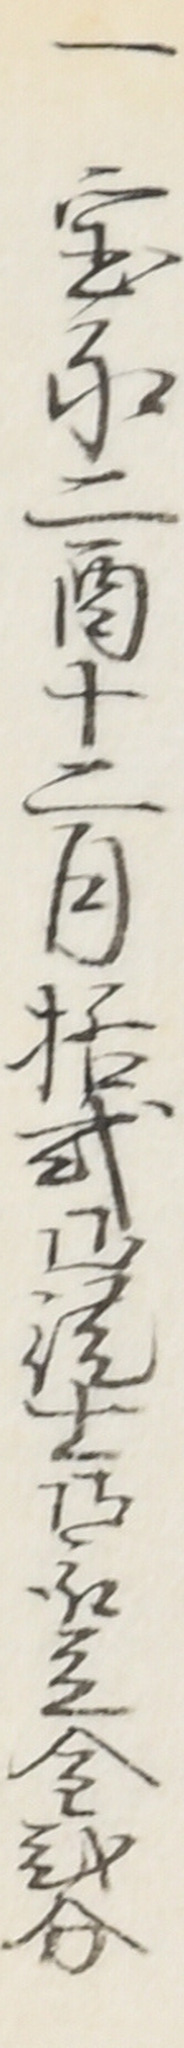一宝永二酉十二月格式御徒士御取立金弐分
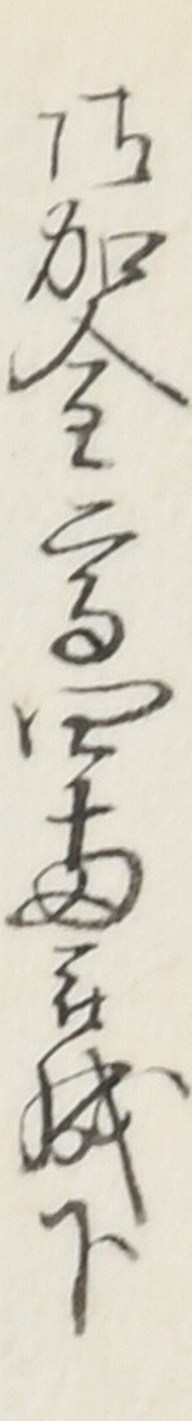御加金高四両被成下
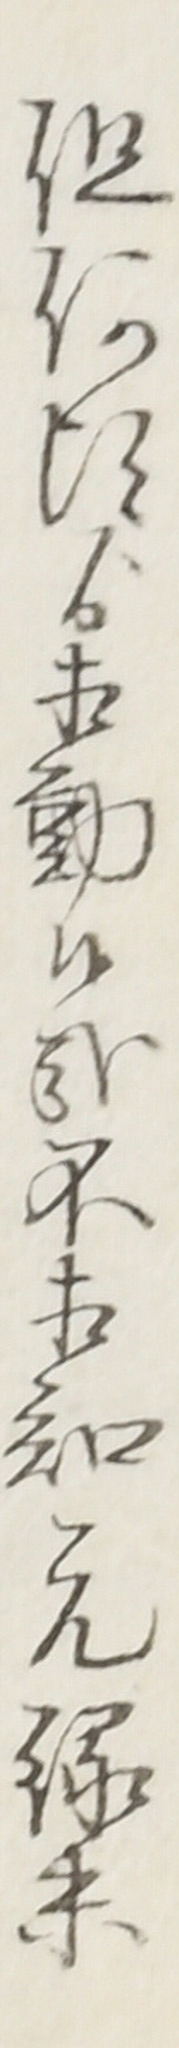但何頃ゟ相勤候哉不相知元禄末
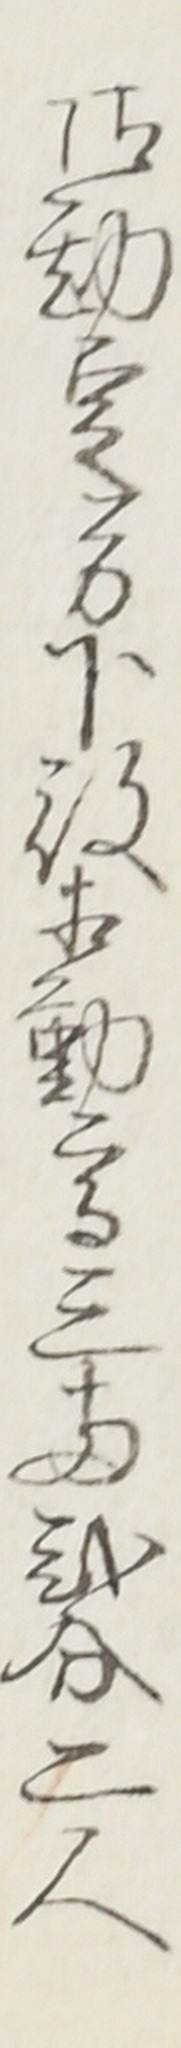御勘定方下役相勤高三両弐分二人
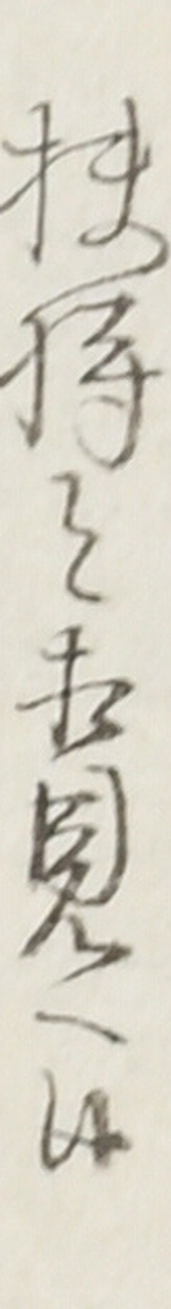扶持と相見へ候
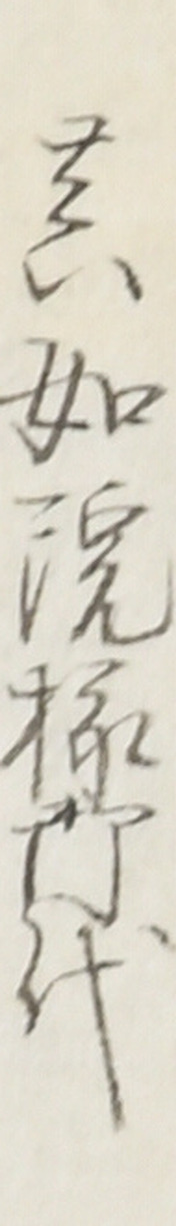真如院様御代
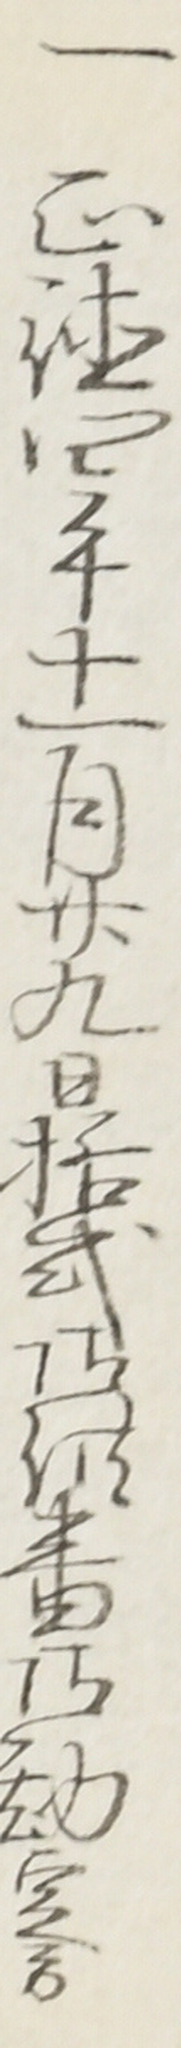一正徳四午十一月廿九日格式御供番御勘定方
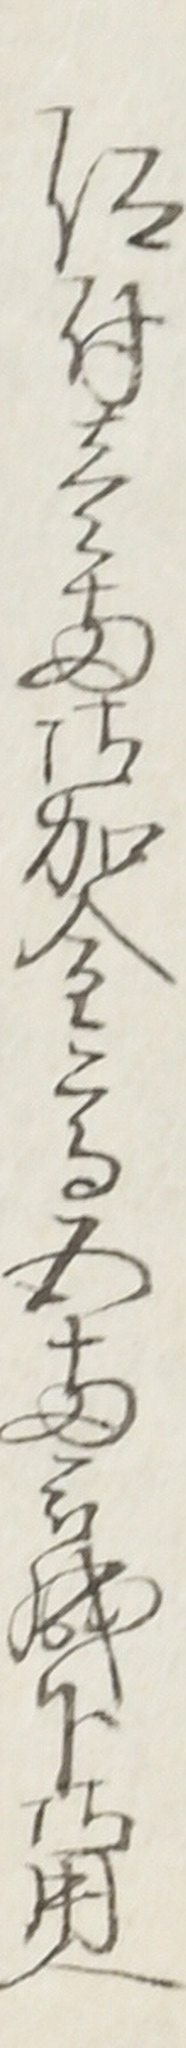被仰付壱両御加金高五両被成下御用人
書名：給人諸士勤仕録（七）
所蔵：伊那市立高遠町図書館・合同会社AMANE
